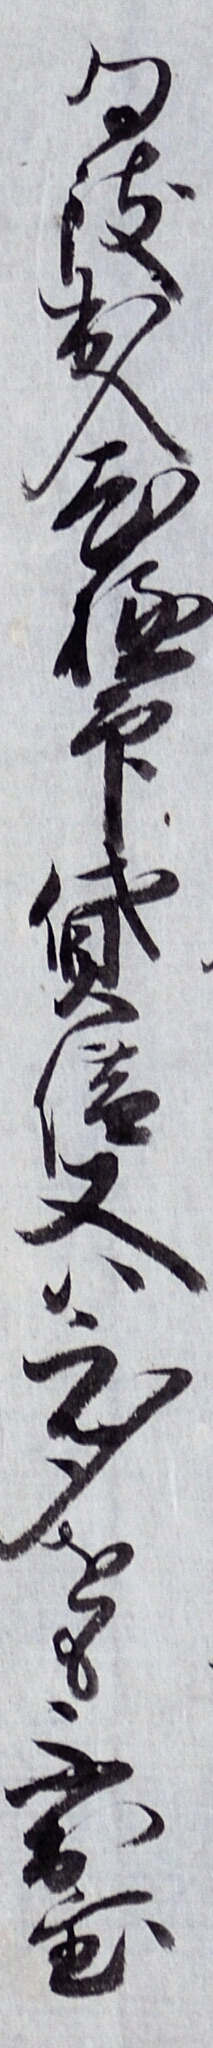為致出入尤極印貸借又ハ元〆をも不出置
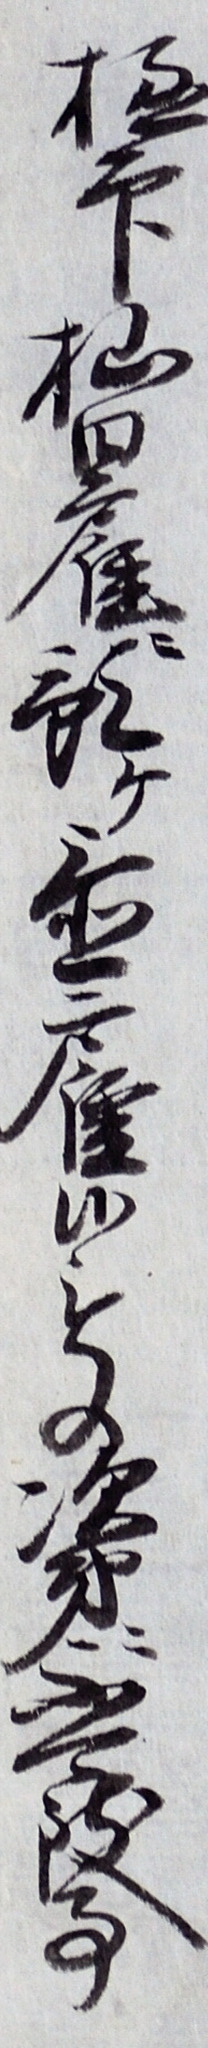極印杣日雇ニ預ヶ置雇候もの次第ニ不可致事
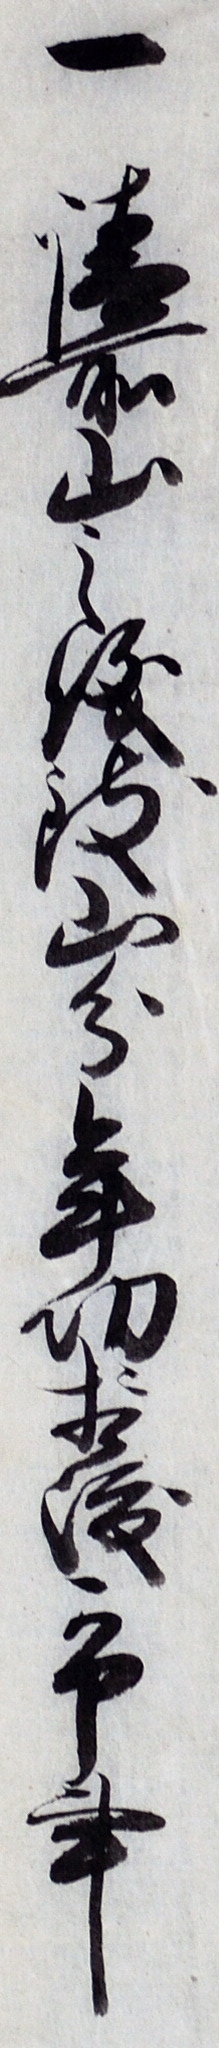一請所山之儀致山分年切ニ相渡可申事
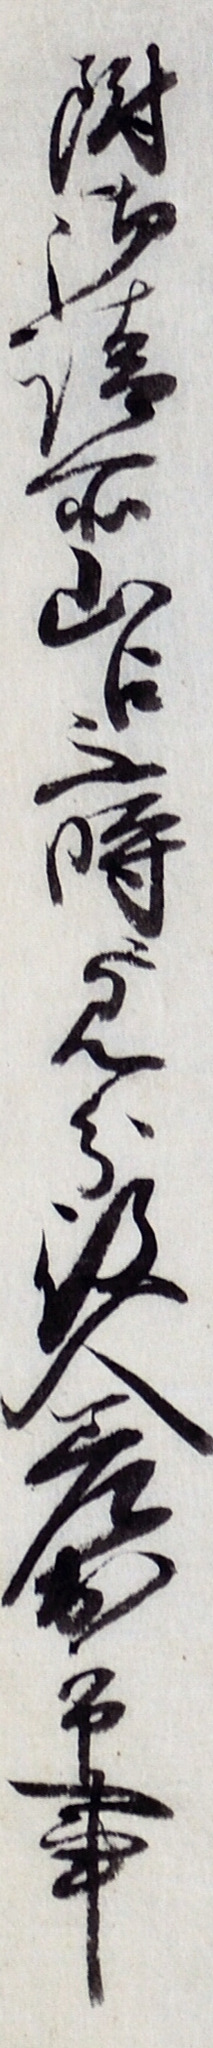附御請所山江不時ニ見分役人差出可申事
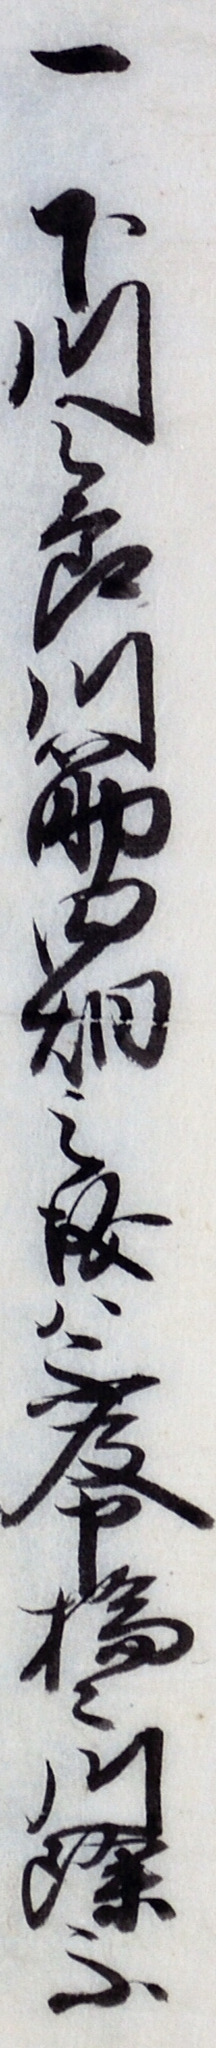一下川之節川筋田畑之儀ハ不及申橋々川除不
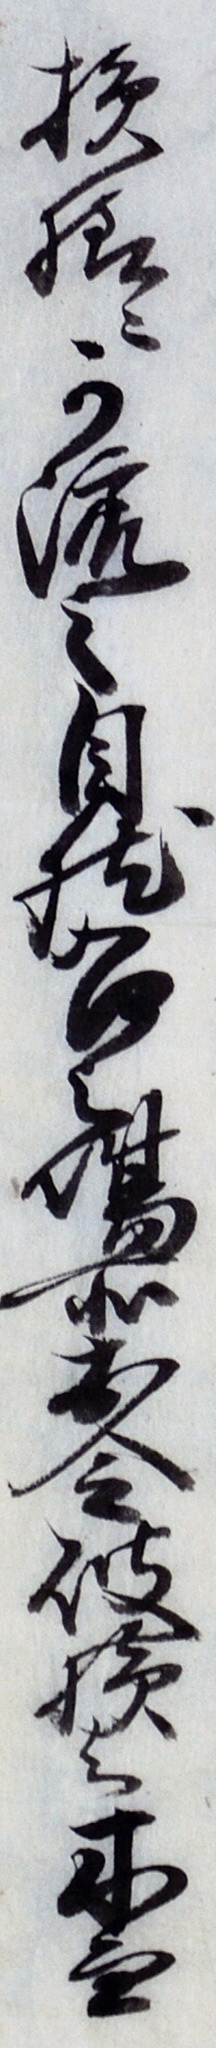損様ニ可流之自然有之場所於令破損者木主
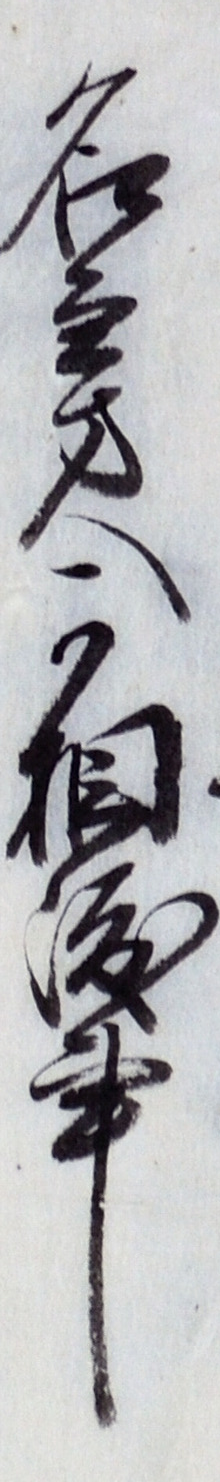名主方へ可相渡事
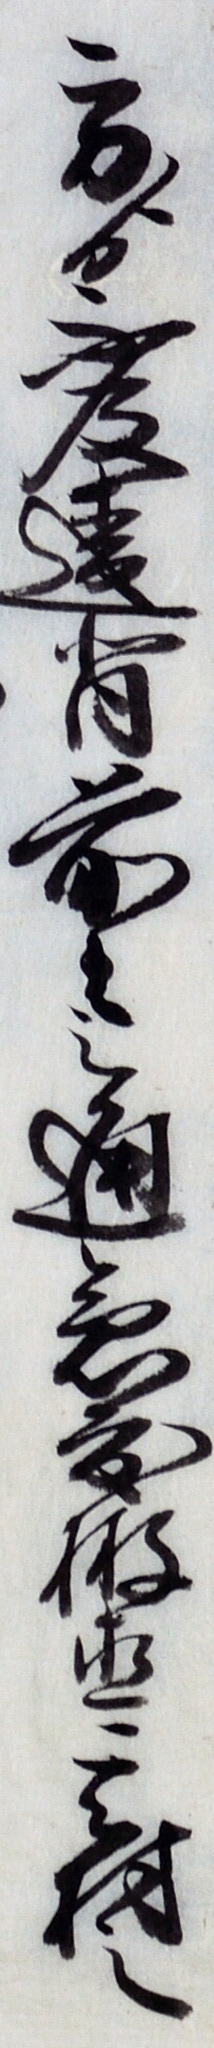方ゟ不及違背前々之通急度拵置其村之
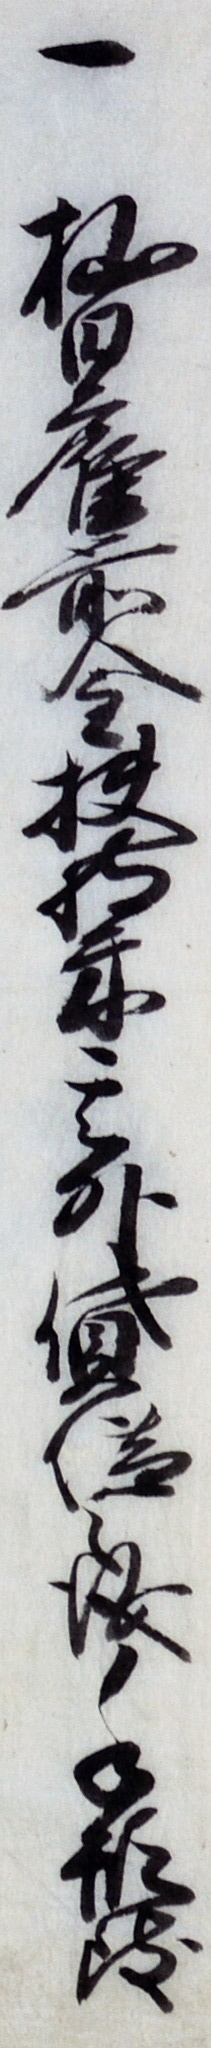一杣日雇前金扶持米其外貸借之儀手形致
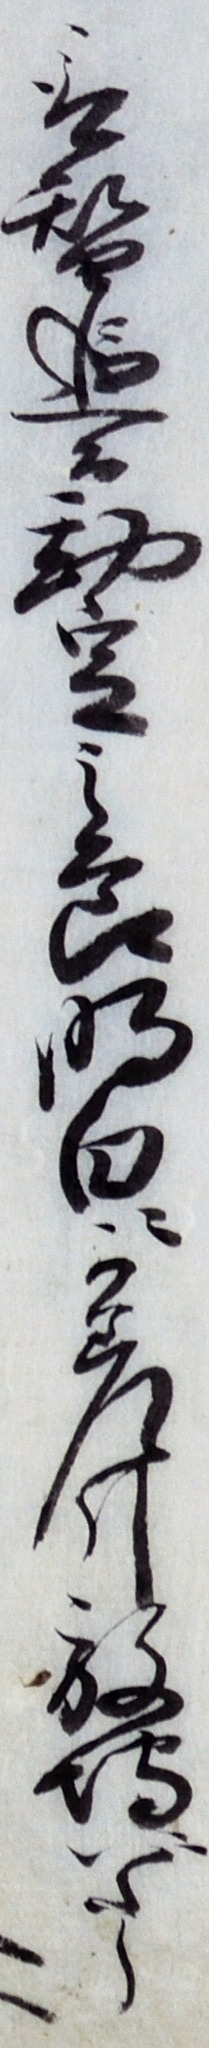取替追而勘定之節明白ニ可差引放埓いたし
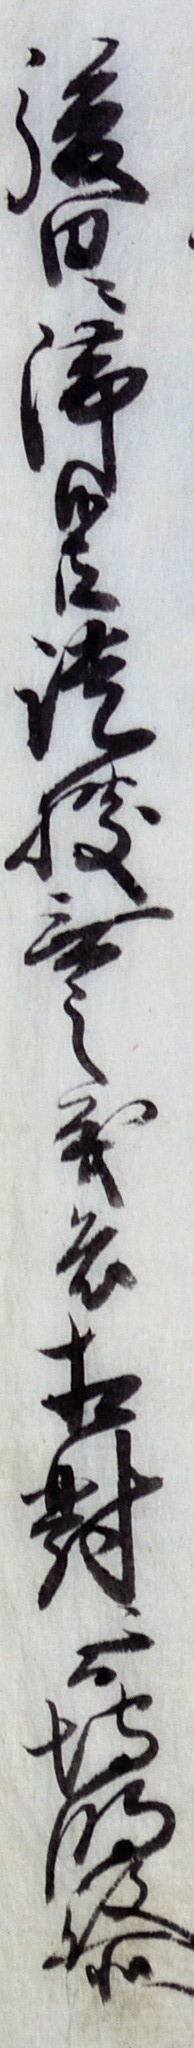後日ニ滞候共証拠無之義者相対ニ而埒明役所へ

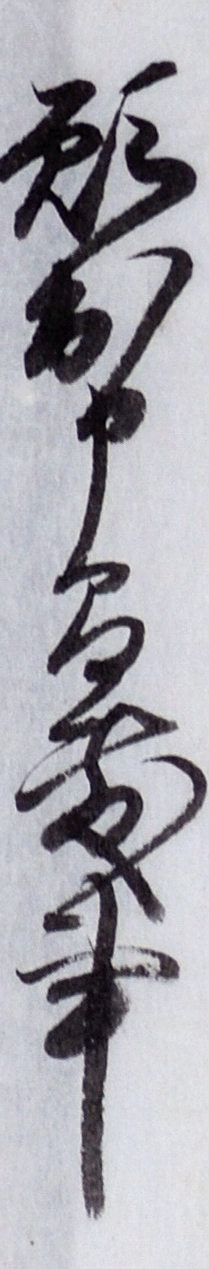願出申間敷事
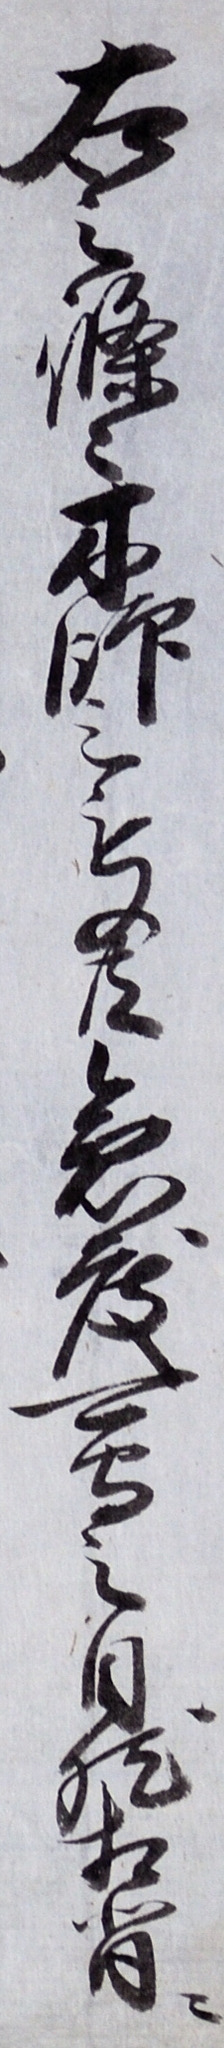右之条々木師之もの共急度可守之自然相背ニ
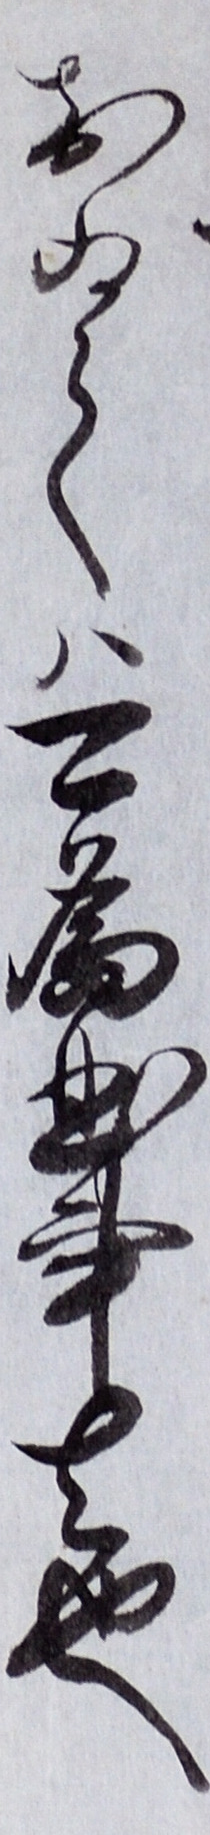おゐてハ可為曲事者也
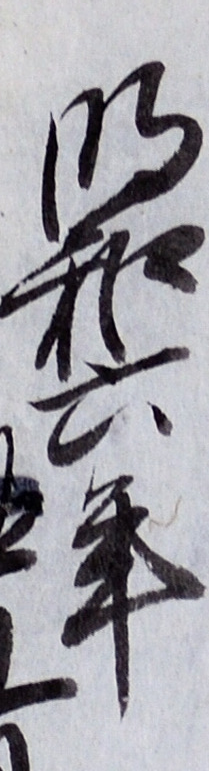明和六年
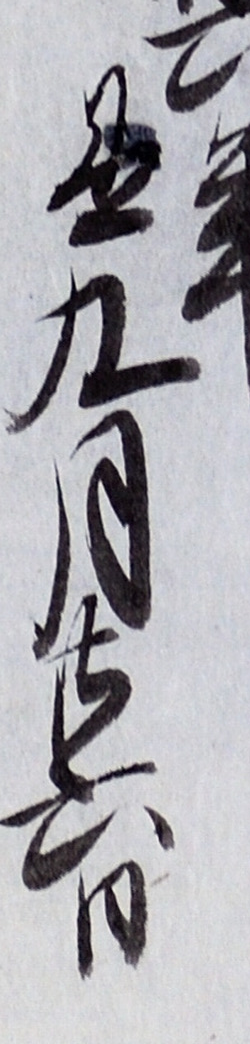丑九月廿六日
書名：御持山御払掟書願書控
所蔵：伊那市立高遠町図書館・合同会社AMANE
